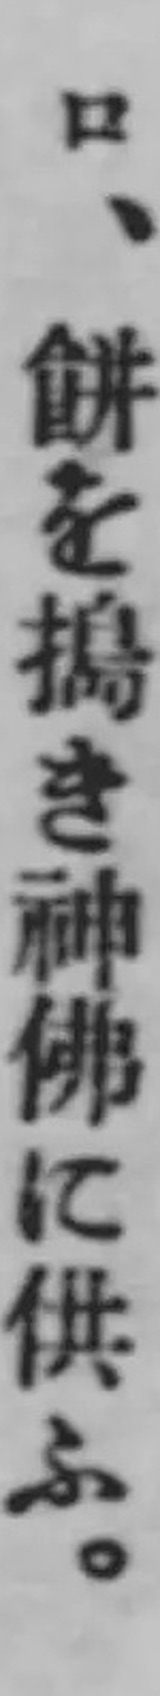ロ、餅を搗き神佛に供ふ。(野依)
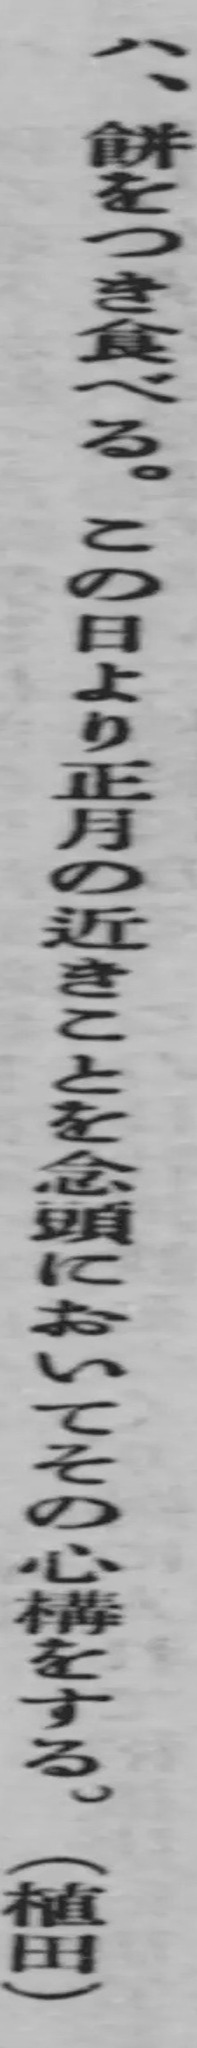ハ、餅をつき食べる。この日より正月の近きことを念頭において心構をする。(植田)
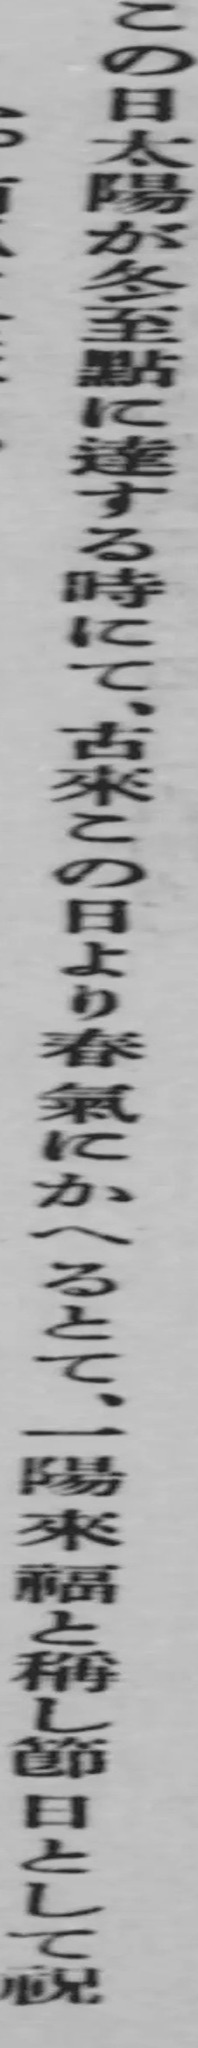この日太陽が冬至點に達する時にて、古來この日より春氣にかへるとて、一陽來福と稱し節日として祝
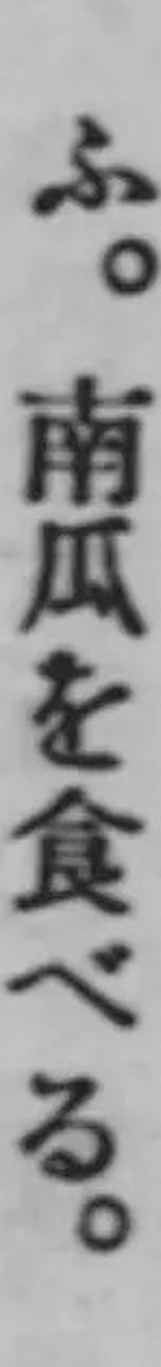ふ。南瓜を食べる。
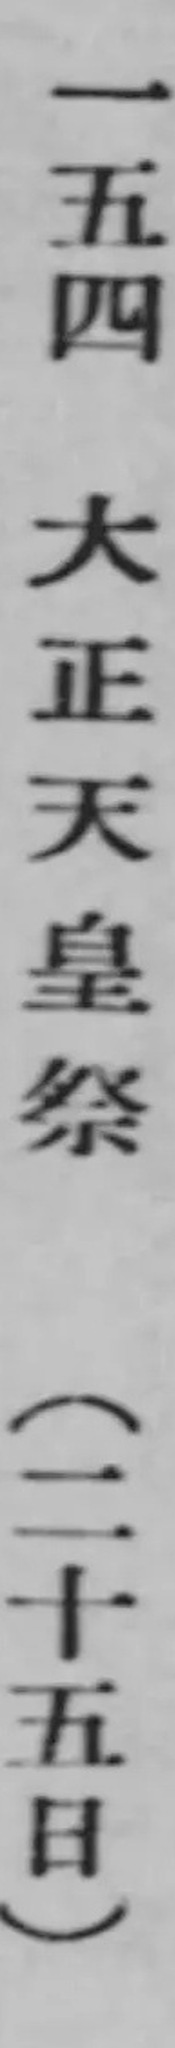一五四大正天皇祭(二十五日)
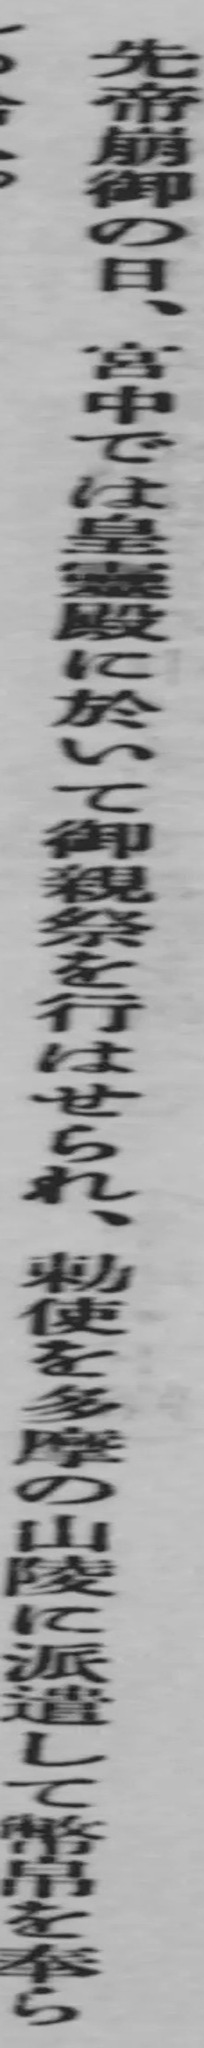先帝崩御の日、宮中では皇靈殿に於いて御親祭を行はせられ、勅使を多摩の山陵に派遣して幣帛を奉ら
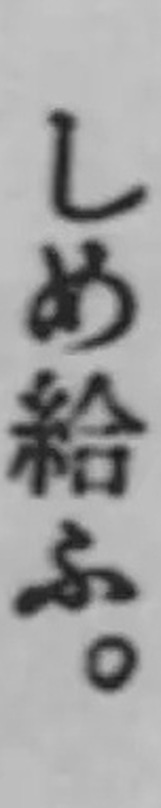しめ給ふ。
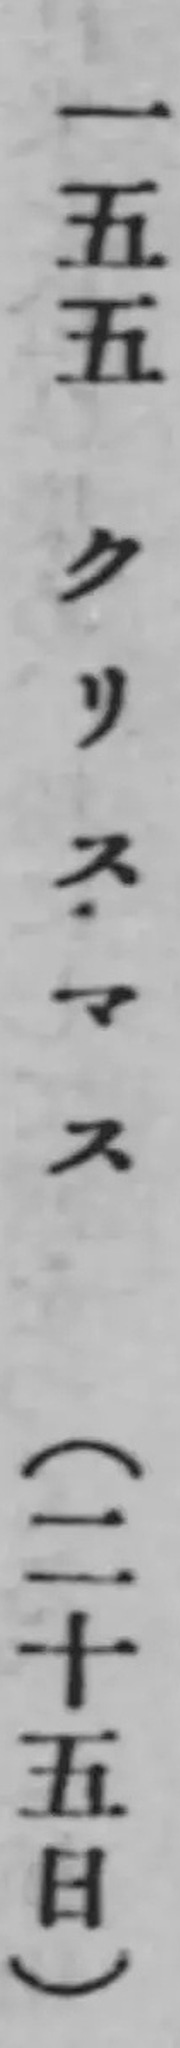一五五クリスマス(二十五日)
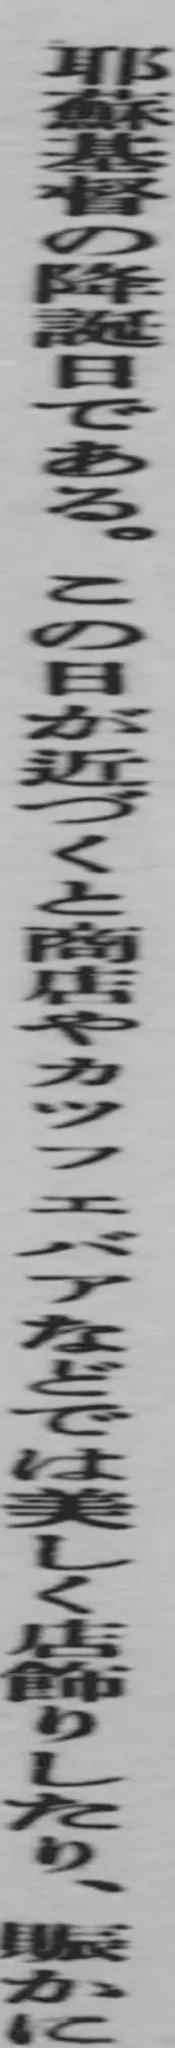耶蘇基督の降誕日である。この日が近づくと商店やカツフエバアなどでは美しく店飾りしたり、賑かに
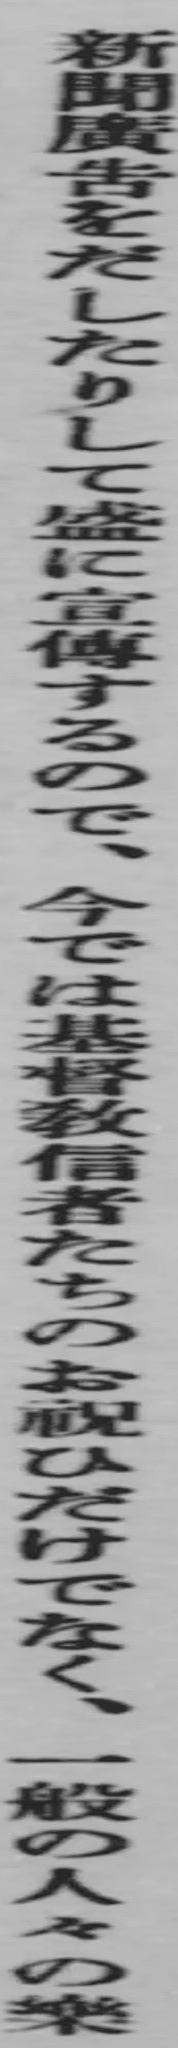新聞廣告をだしたりして盛に宣傳するので、今では基督敎信者たちのお祝ひだけでなく、一般の人々の樂
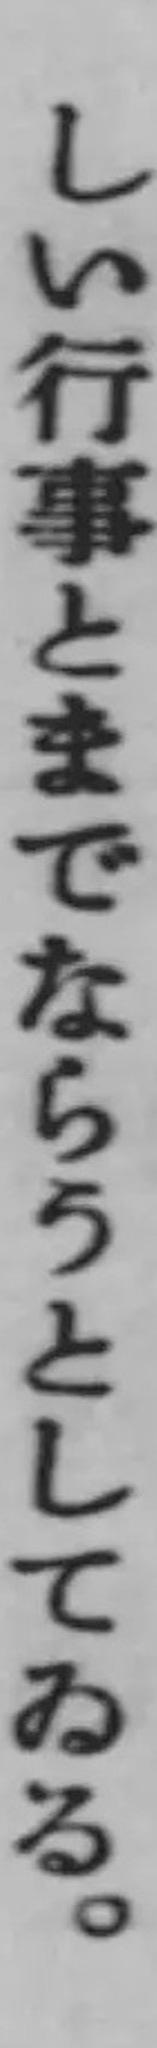しい行事とまでならうとしてゐる。
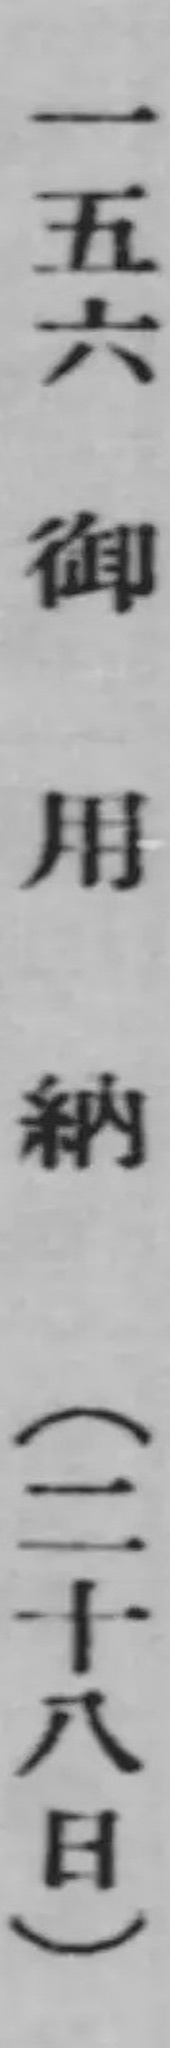一五六御用納(二十八日)
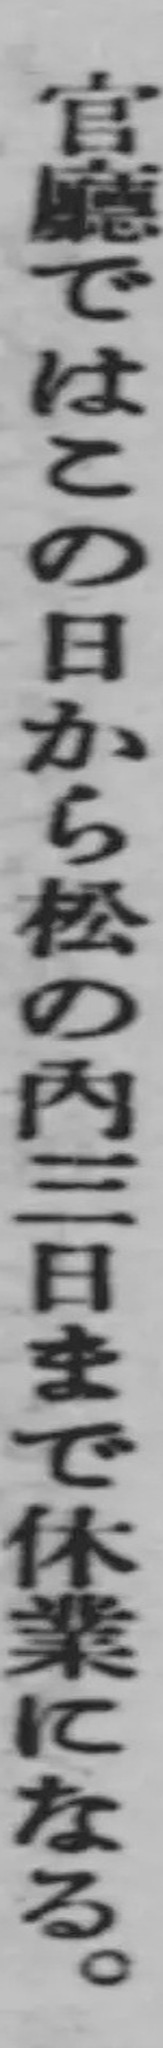官廳ではこの日から松の内三日まで休業となる。
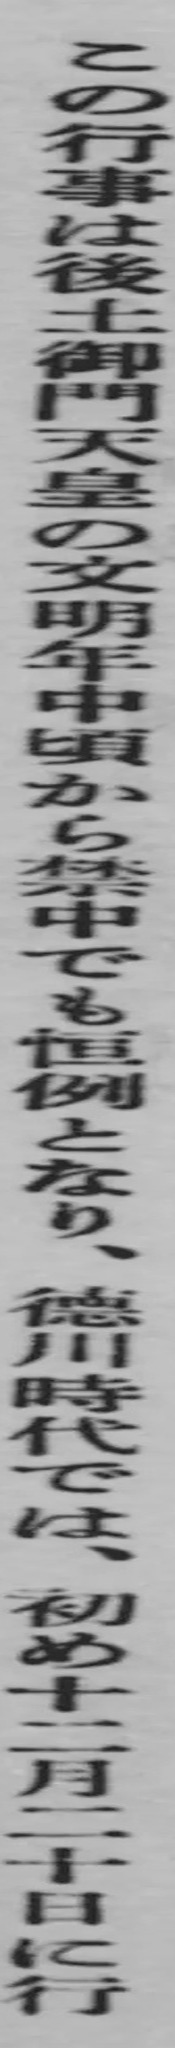この行事は後土御門天皇の文明年中頃から禁中でも恒例となり、德川時代では、初め十二月二十日に行
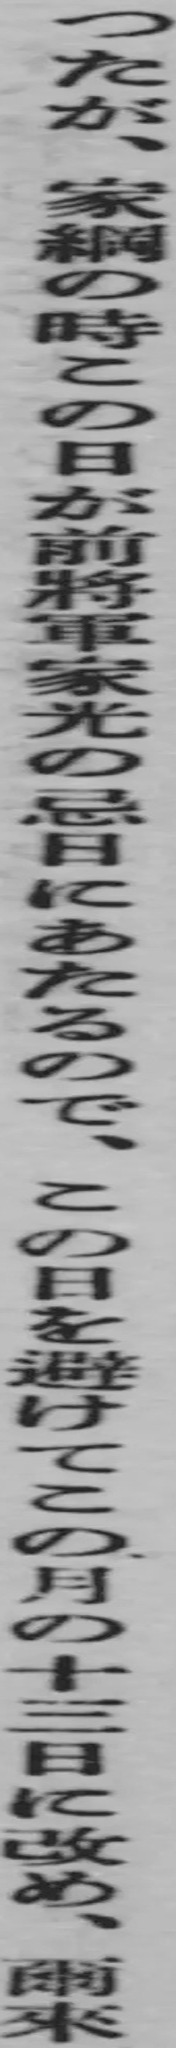つたが、家綱の時この日が前將軍家光の忌日にあたるので、この日を避けてこの月の十三日に改め、爾來
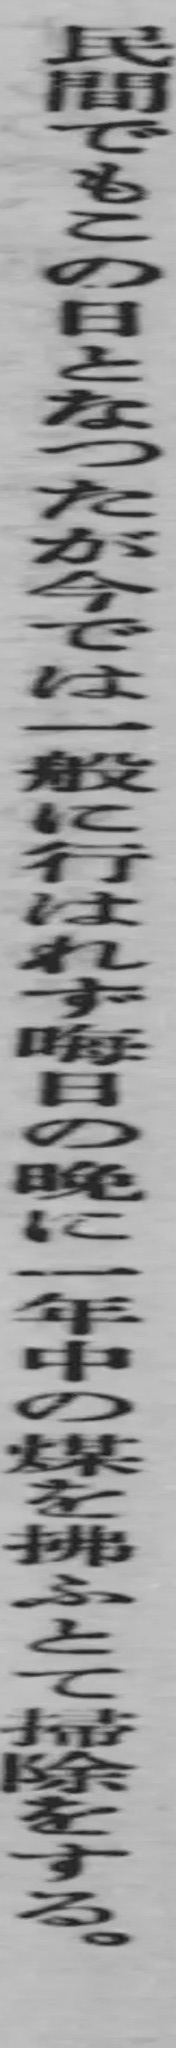民間でもこの日となつたが今では一般に行はれず晦日の晩に一年中の煤を拂ふとて掃除をする。
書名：豊橋の年中行事
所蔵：国立国会図書館 National Diet Library, JAPAN
